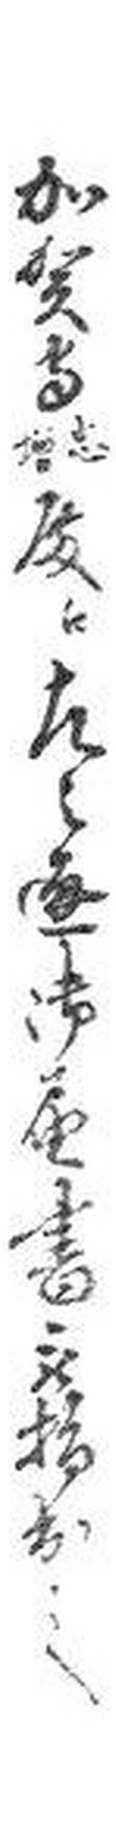加賀守忠増殿江左之通御届書被指出之
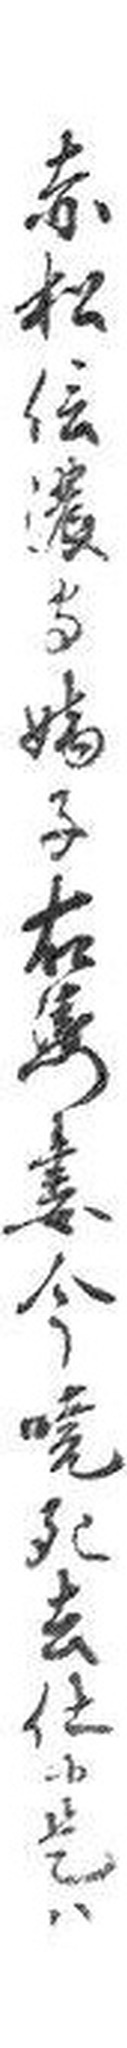赤松信濃守嫡子右衛門妻今暁死去仕候是ハ
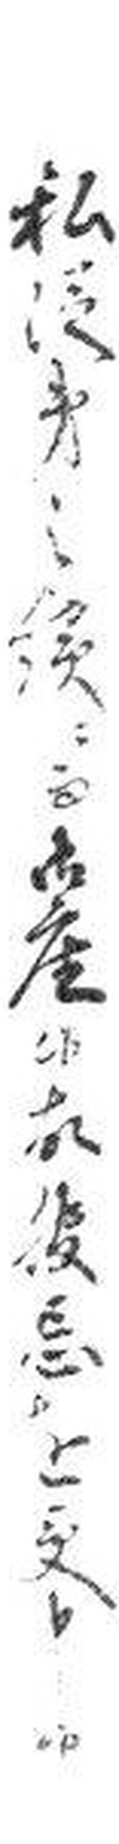私従弟之続ニ而御座候故服忌を受申候
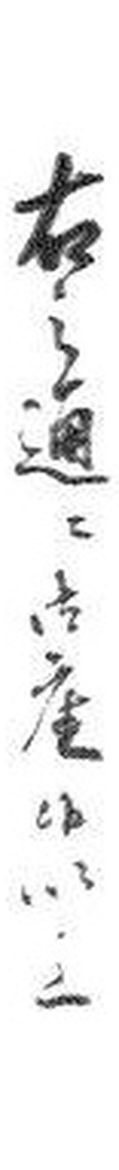右之通ニ御座候以上
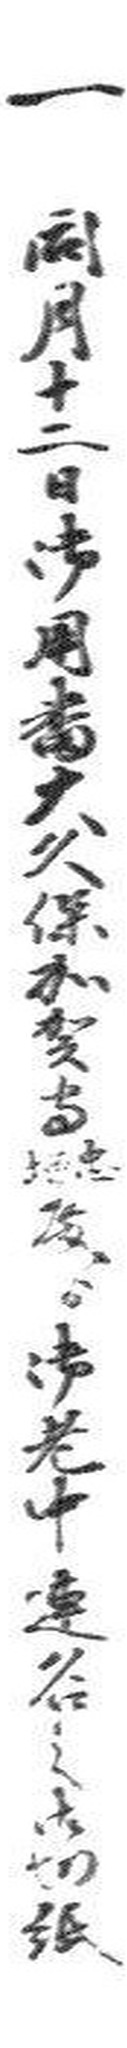一同月十二日御用番大久保加賀守忠増殿ゟ御老中連名之御切紙
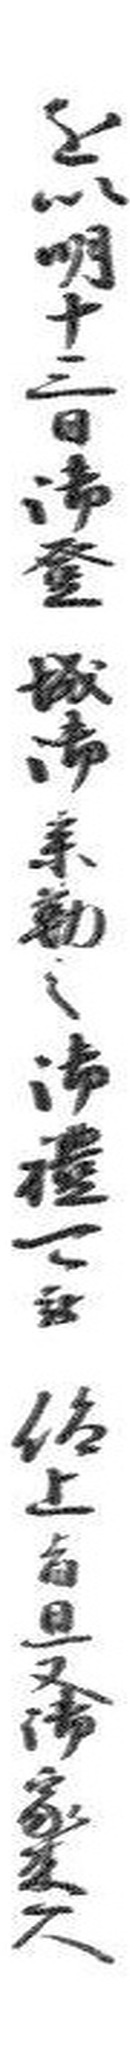を以明十三日御登城御参勤之御礼可被仰上旨且又御家来一人
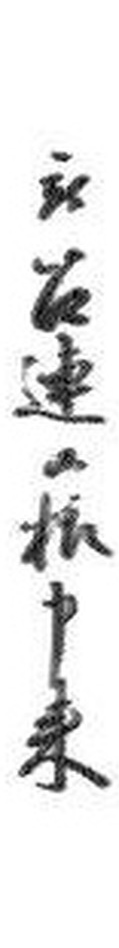被召連候様申来
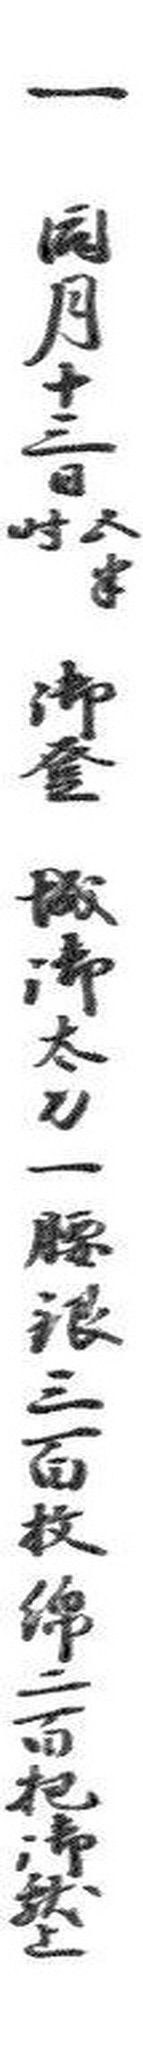一同月十三日五半時御登城御太刀一腰銀三百枚綿二百把御献上
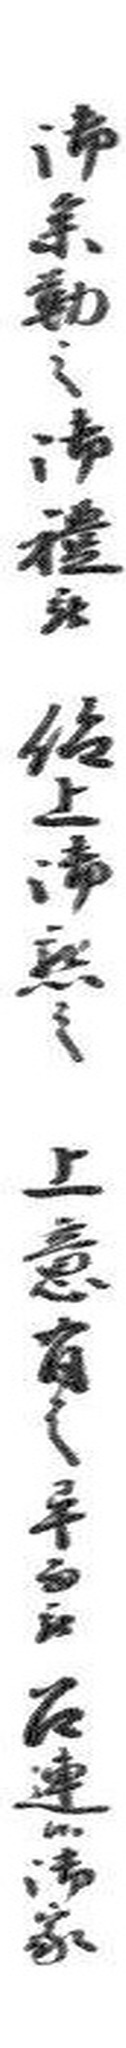御参勤之御礼被仰上御懇之上意有之畢而被召連候御家
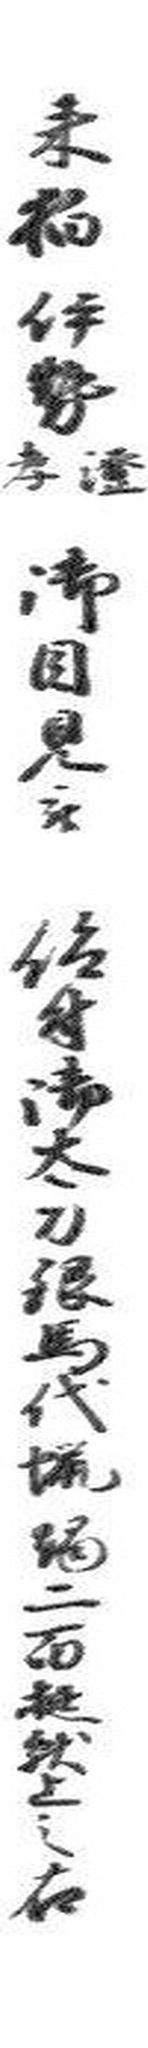来狛伊勢澄孝御目見被仰付御太刀銀馬代蠟燭二百挺献上之右
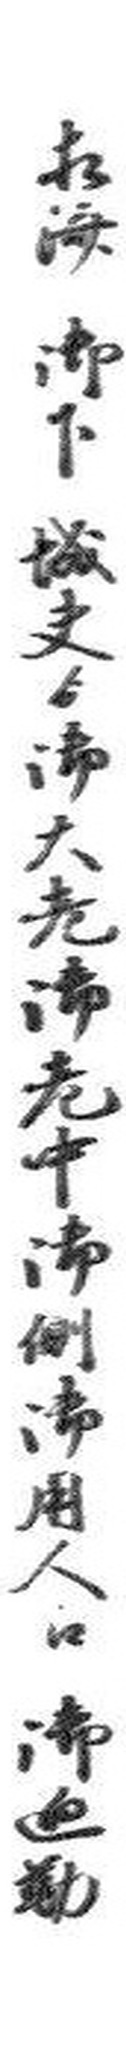相済御下城夫ゟ御大老御老中御側御用人江御廻勤
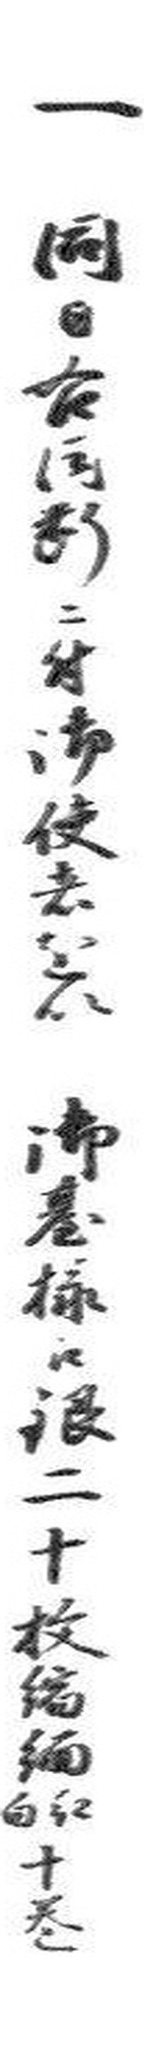一同日右同断ニ付御使者を以御台様江銀二十枚縮緬紅白十巻
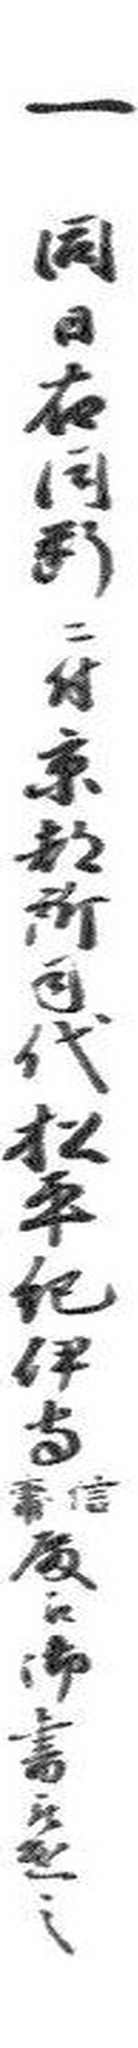一同日右同断ニ付京都所司代松平紀伊守信庸殿江御書被遣之

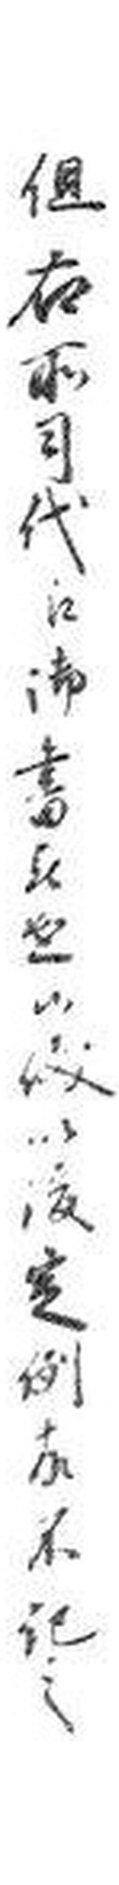但右所司代江御書被遣候儀以後定例故不記之
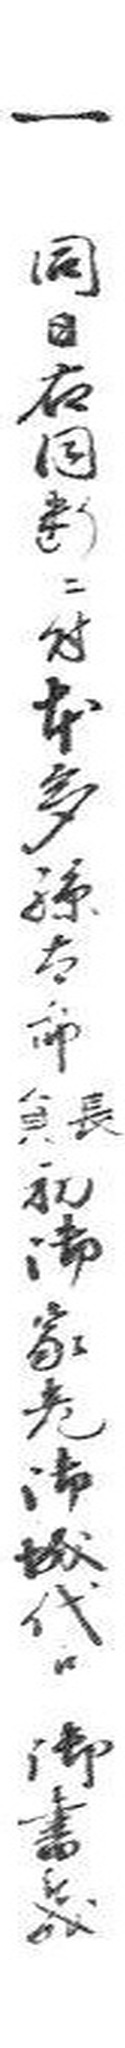一同日右同断ニ付本多孫太郎長員初御家老御城代江御書被成
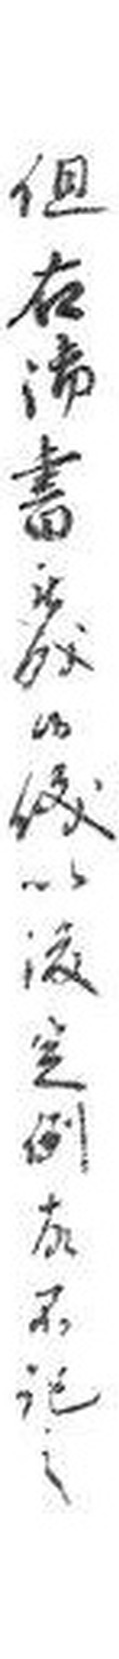但右御書被成候儀以後定例故不記之
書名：家譜 二十九 吉邦公 従正徳二年到正徳三年
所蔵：福井県文書館 Fukui Prefectural Archives
